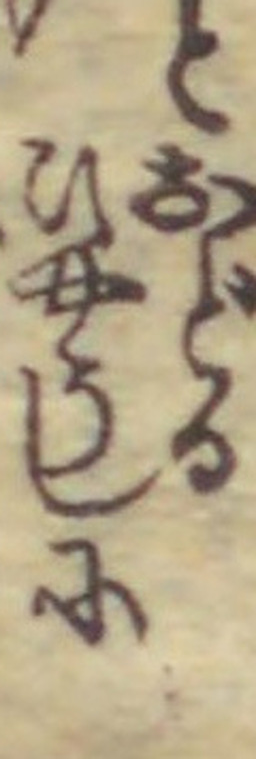ひやうしに
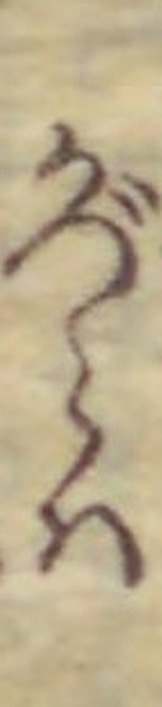かづらは
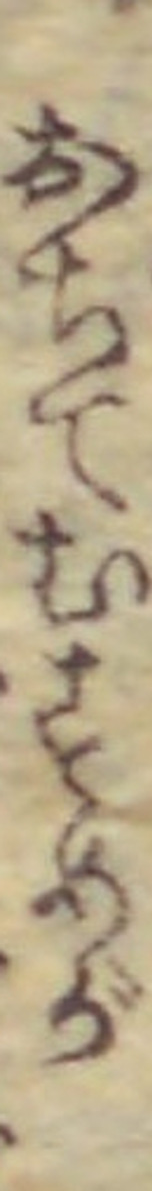おちてむすめが
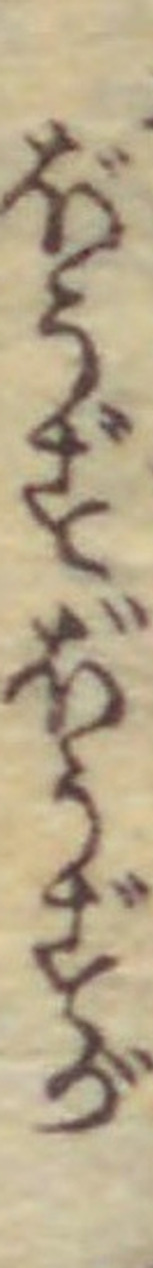ぼうずぼうずが
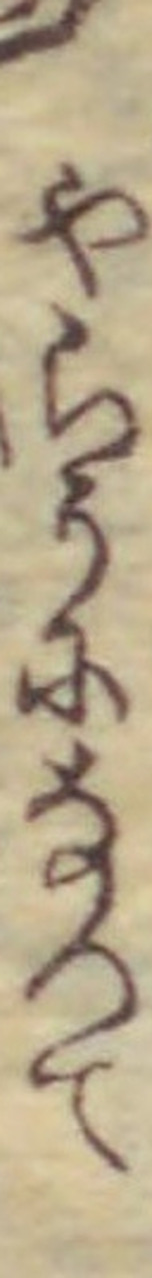やらうになつて
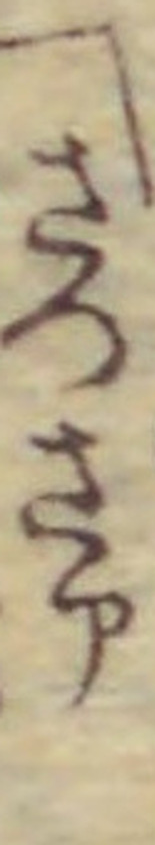〽さつさァ
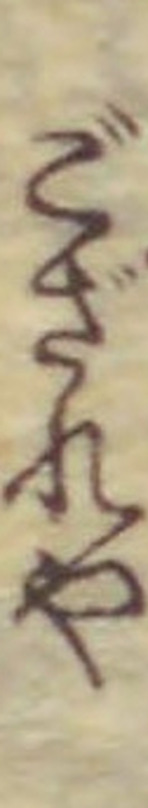ござれや
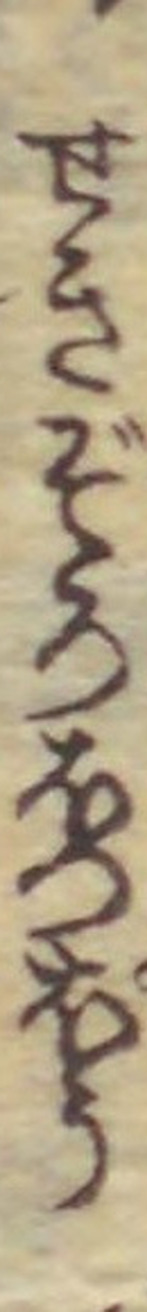せきぞろほつぽう
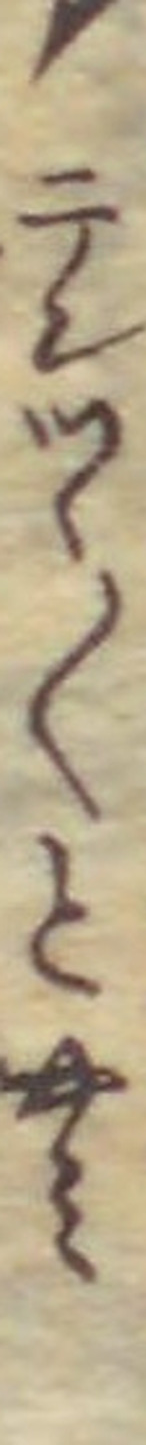テンツヽ〳〵とやみ
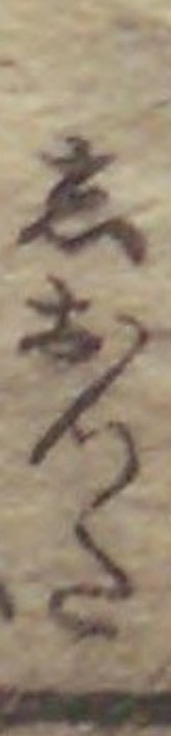しおつた
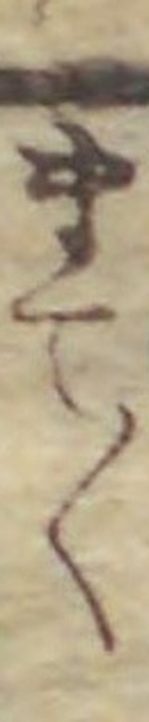まて〳〵
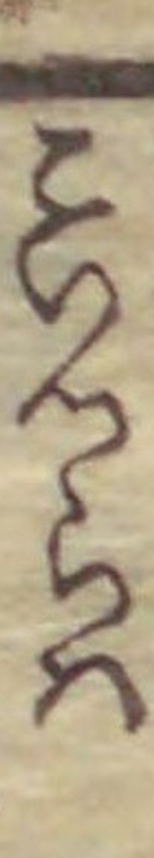こいつらは
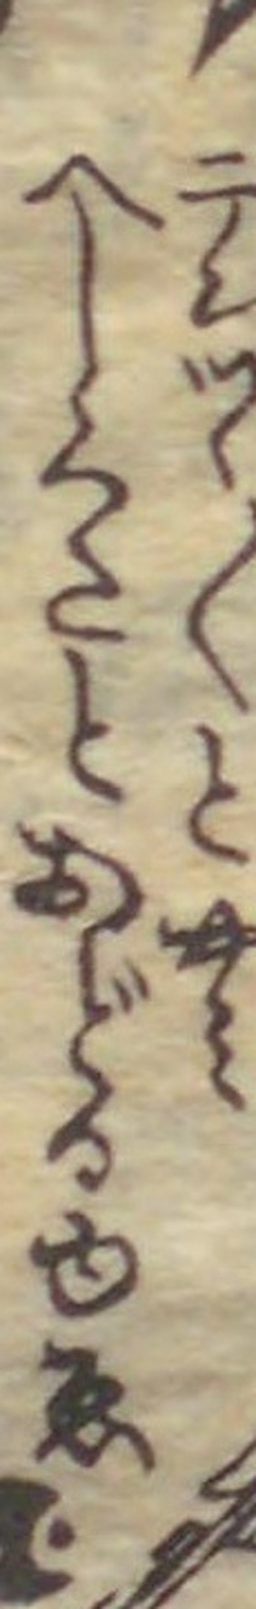へしくたとおどるゆゑ●
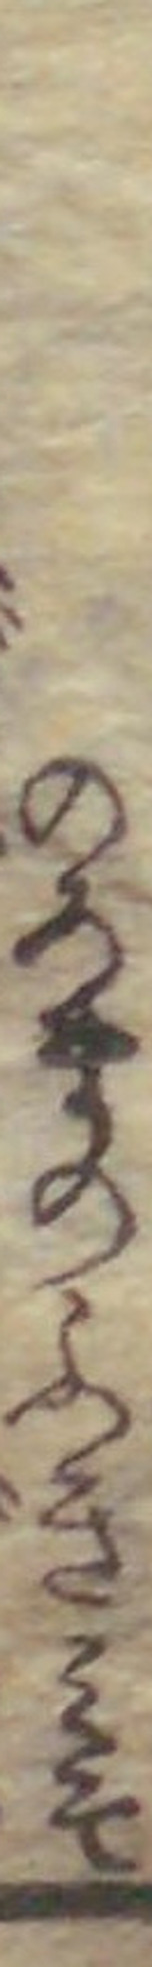のろまのふきみそ
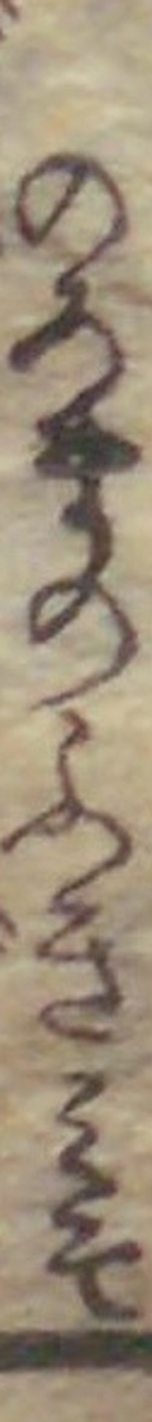のろまのふきみそ
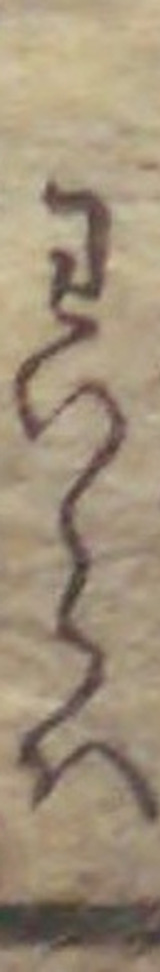わいらは
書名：大時代唐土化物 3巻. 曽我太夫染
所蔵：国立国会図書館 National Diet Library, JAPAN
